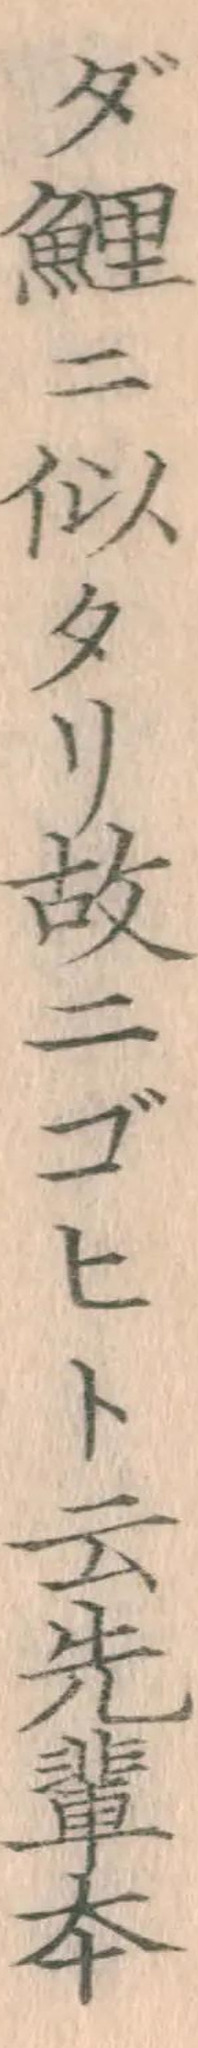ダ鯉ニ似タリ故ニゴヒト云先輩本
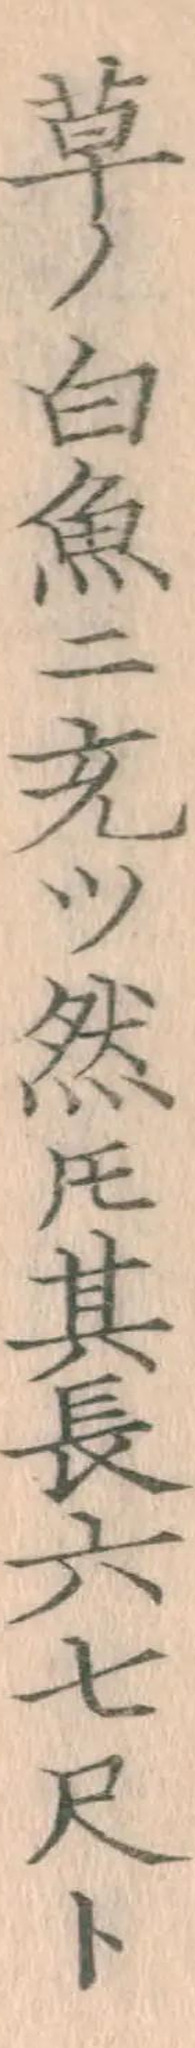草ノ白魚ニ充ツ然トモ其長六七尺ト
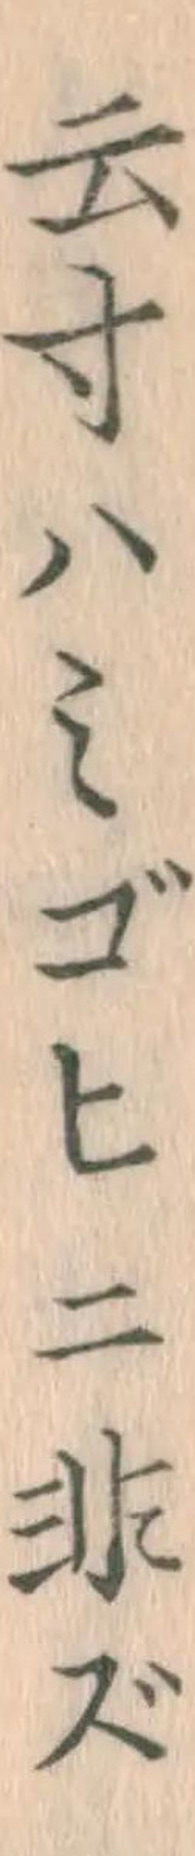云寸ハミゴヒニ非ズ

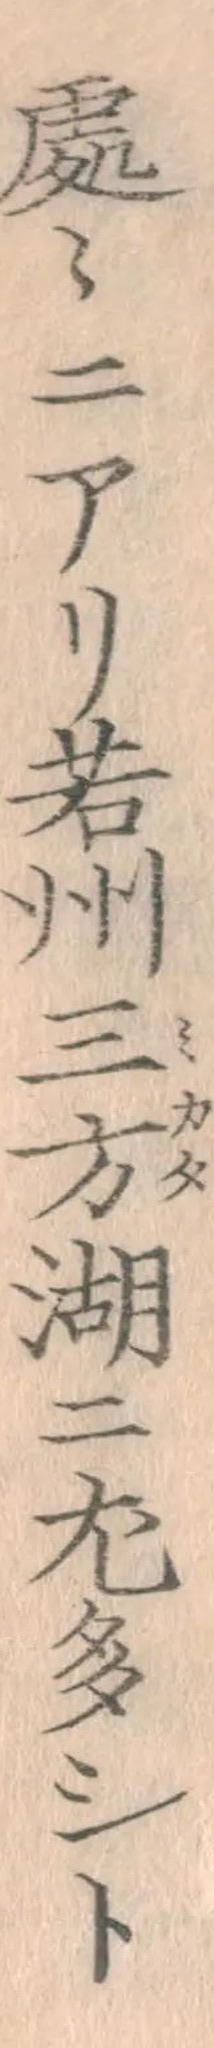処々ニアリ若州三方湖ニ左多シト
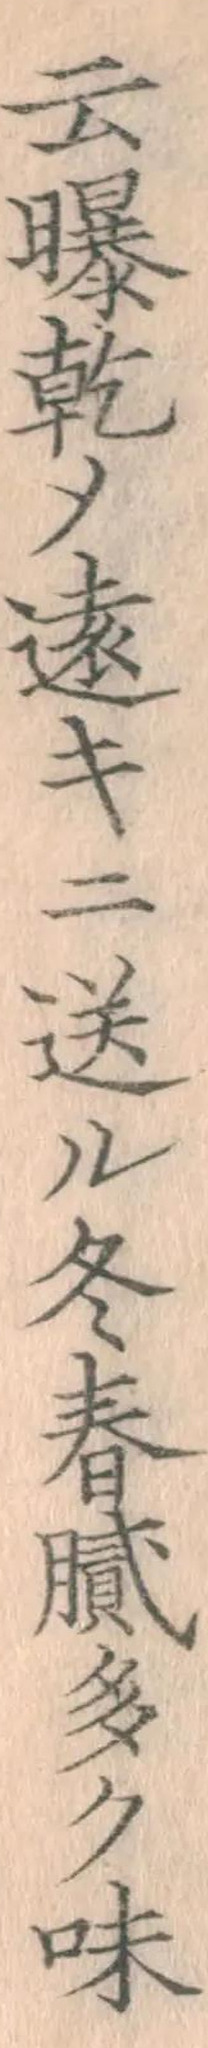云曝乾シテ遠キニ送ル冬春賦多ク味
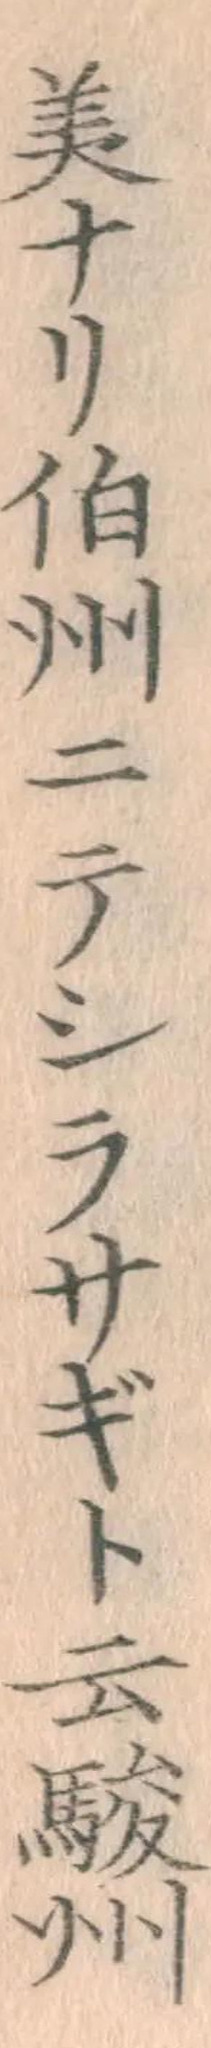美ナリ伯州ニテシラサギト云駿州
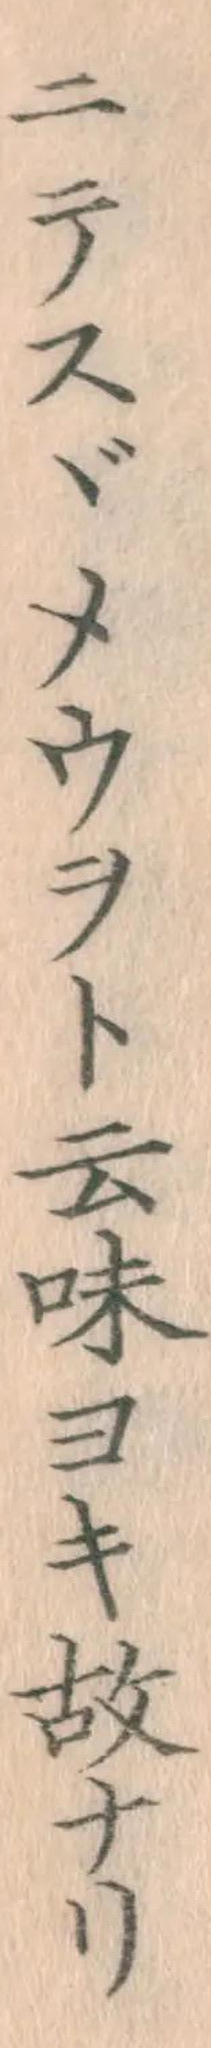ニテスヾメウヲト云味ヨキ故ナリ
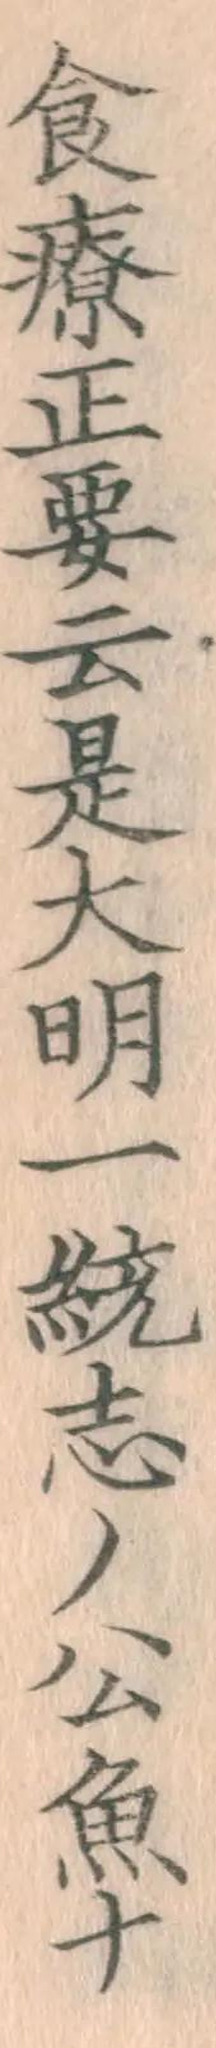食療正要云是大明一統志ノ公魚ナ
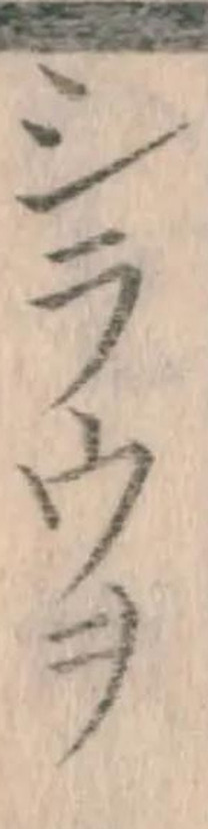シラウヲ
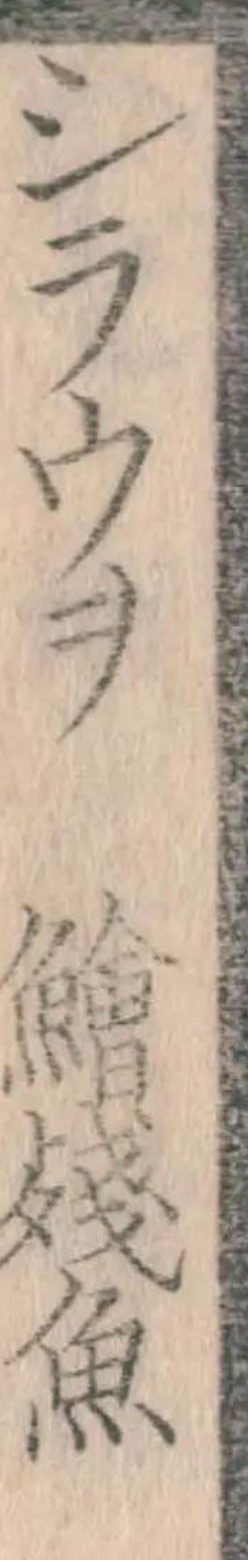シラウヲ鱠残魚
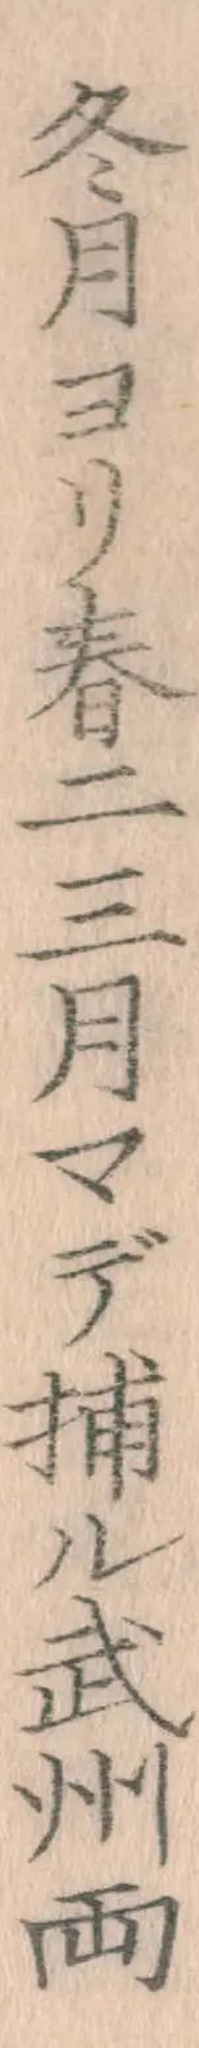冬月ヨリ春二三月マデ捕ル武州両
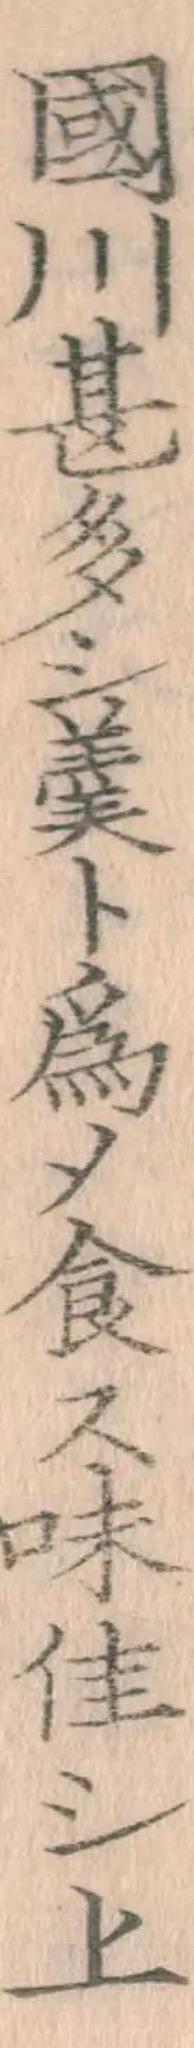国川甚多シ羹ト為シテ食ス味佳シ上
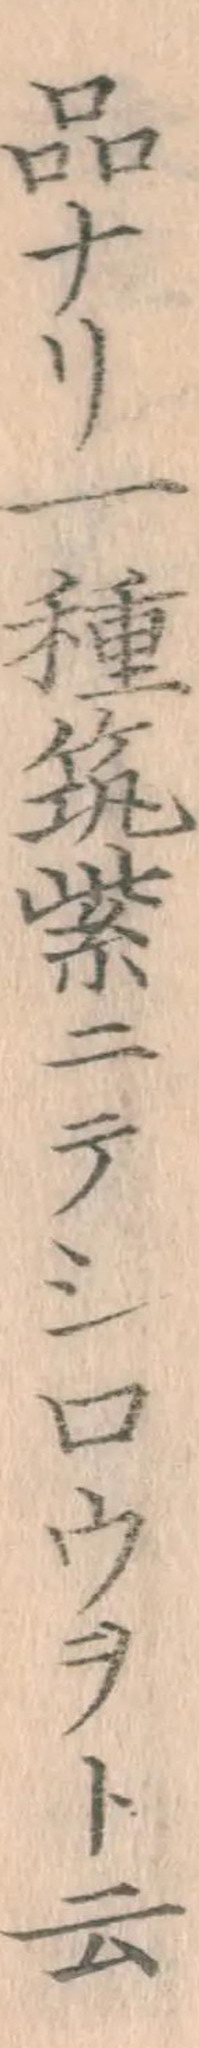品ナリ一種筑紫ニテシロウヲト云
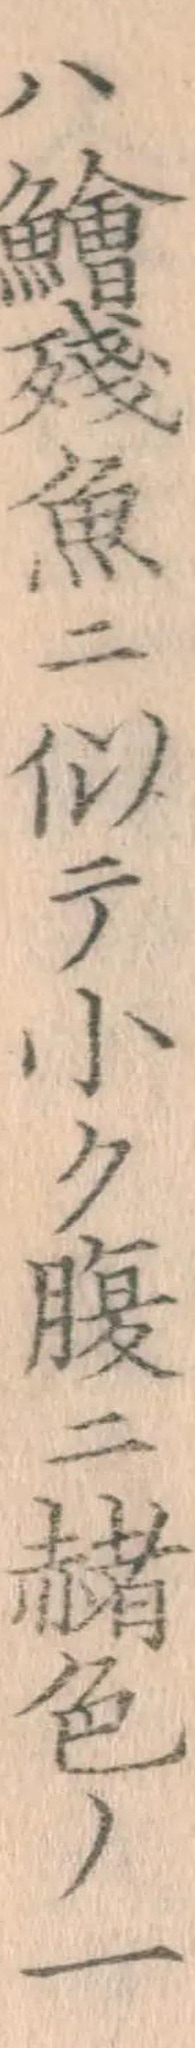ハ鱠残魚ニ似テ小ク腹ニ赭色ノ一
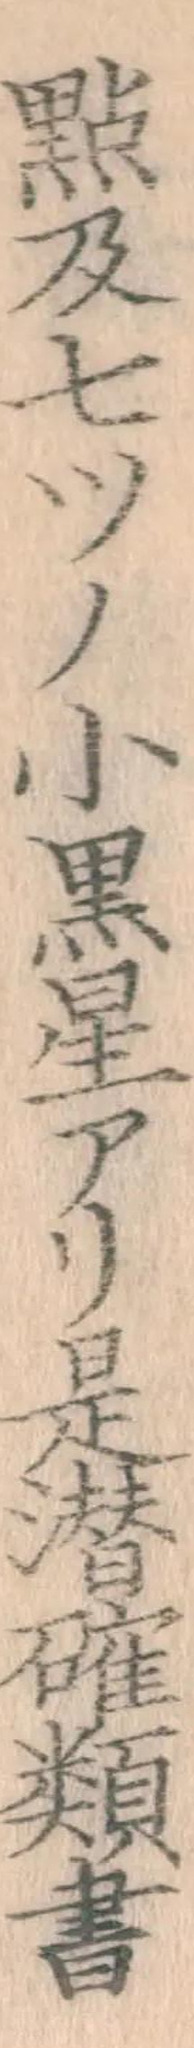点及七ツノ小黒星アリ是潜確類書
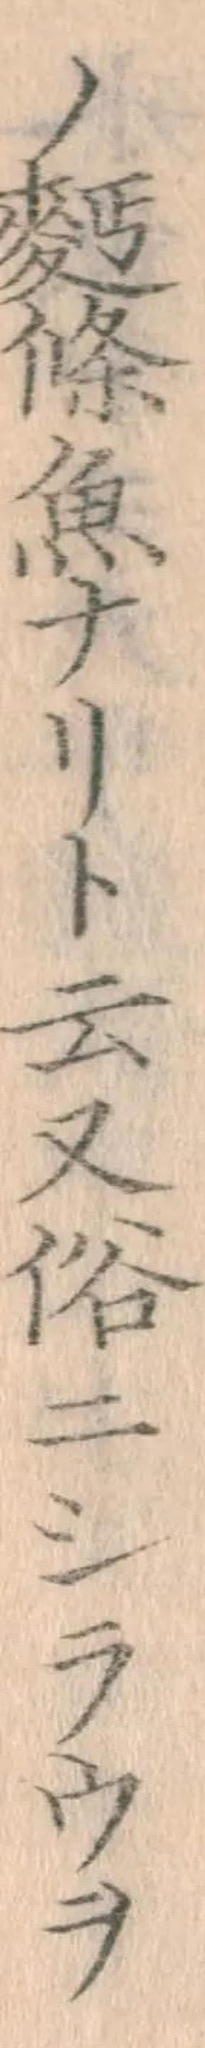ノ麺条魚ナリト云又俗ニシラウヲ
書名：皇和魚譜 2巻
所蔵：国立国会図書館 National Diet Library, JAPAN
